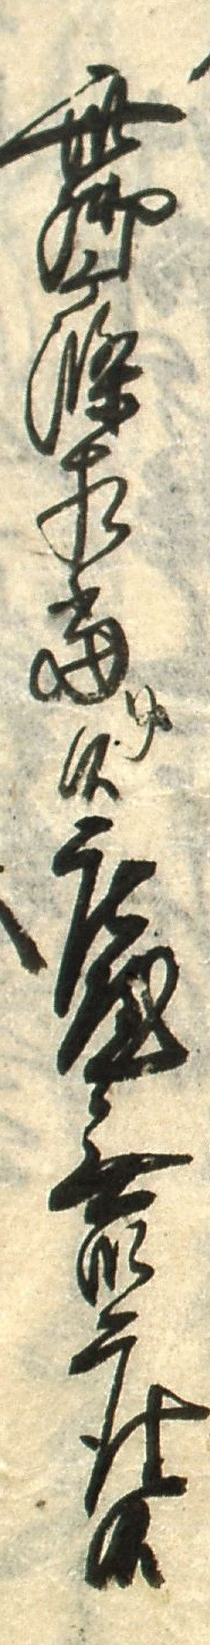此御ヶ條相當り候庄屋無御座候
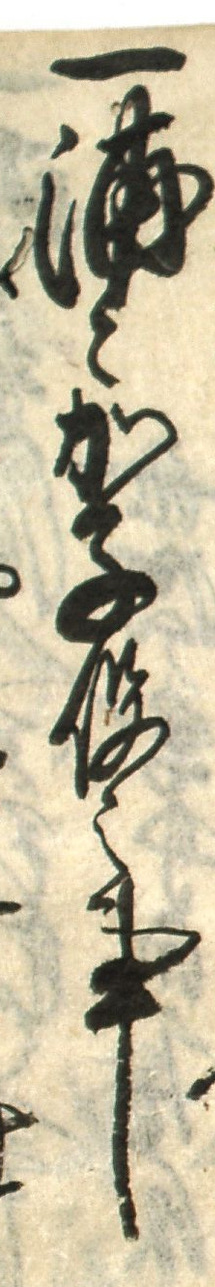一浦々加子役之事
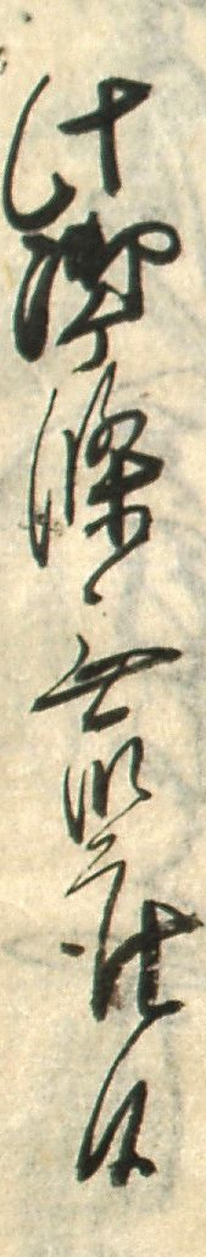此御ヶ條無御座候

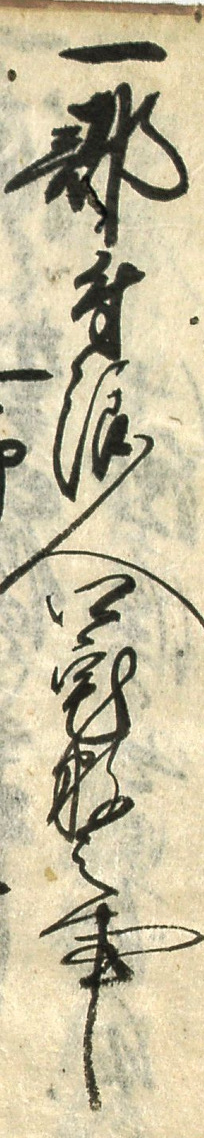一郡付浪人郷宅数之事
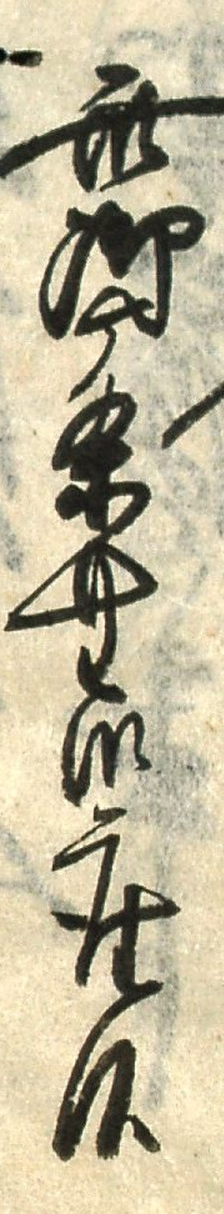此御ヶ条無御座候
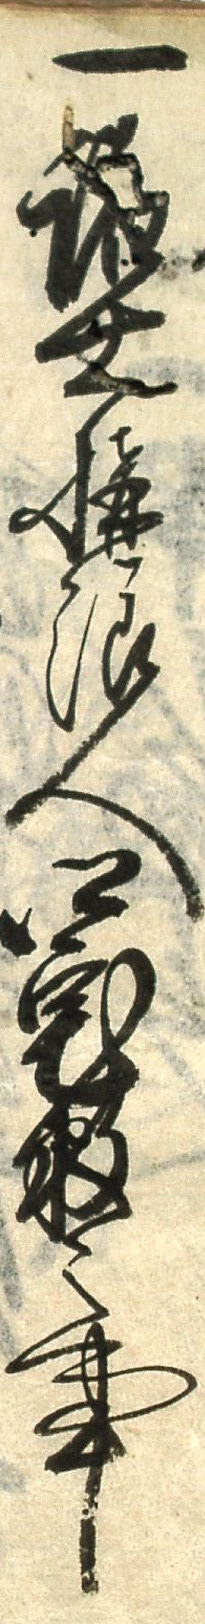一諸士構浪人郷宅数之事
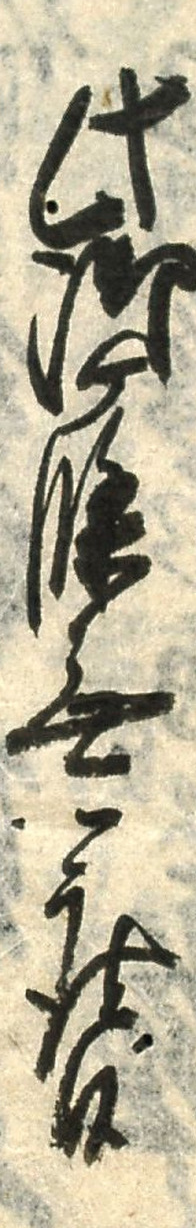此御ヶ條無御座候
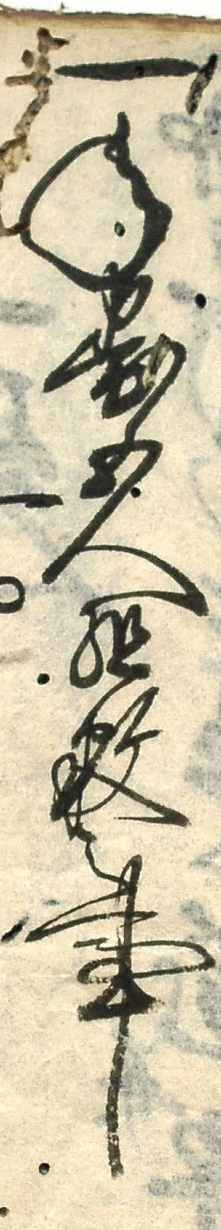一年寄五人組数之事
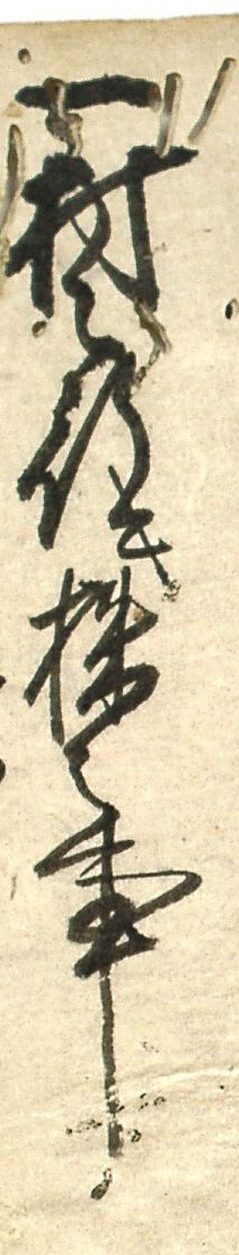一村之行キ株之事
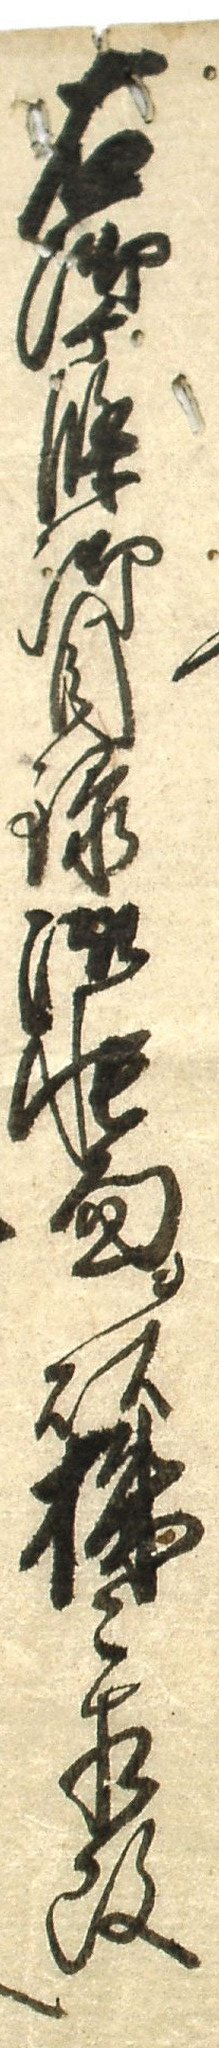右御ヶ條御目録御帳面ヲ以株々相改
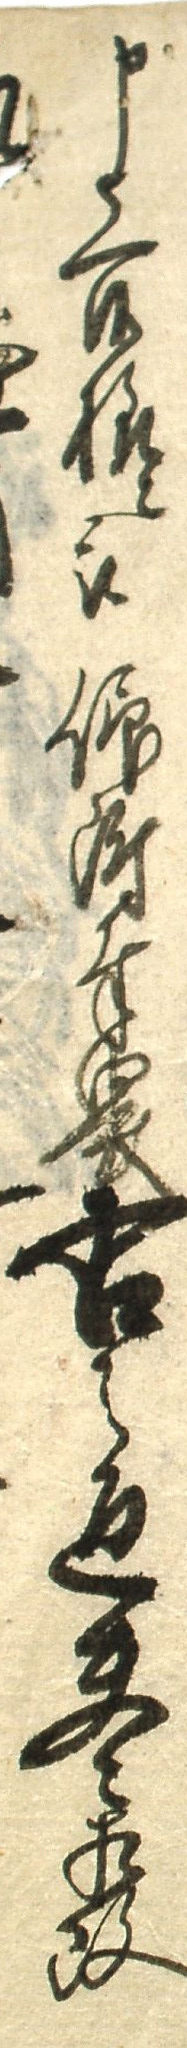申上候様ニ被仰附奉畏右之通夫々相改
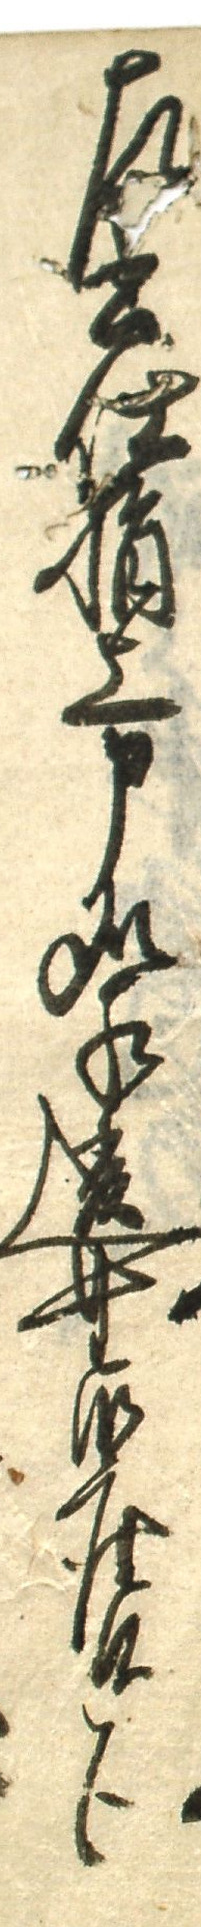左書付指上申処相違無御座候以上
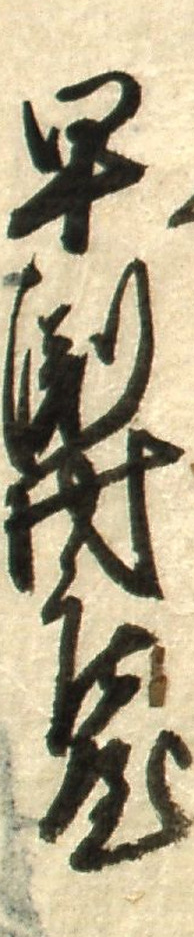早渕村庄屋
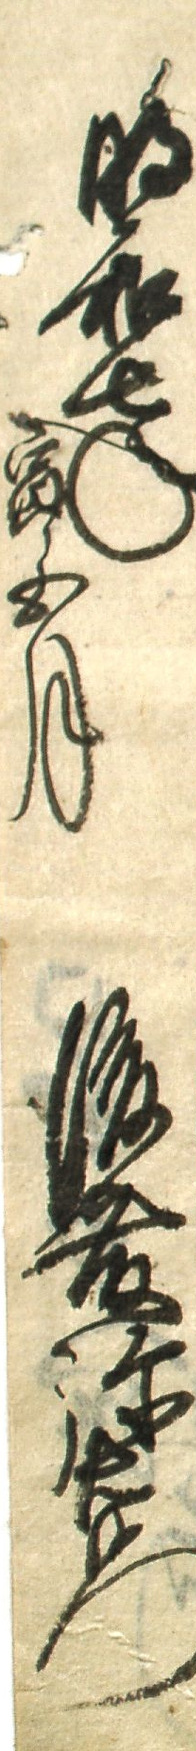明和七年後藤弥右衛門

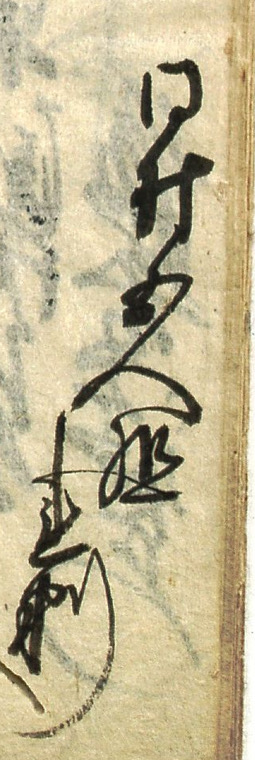同村五人組
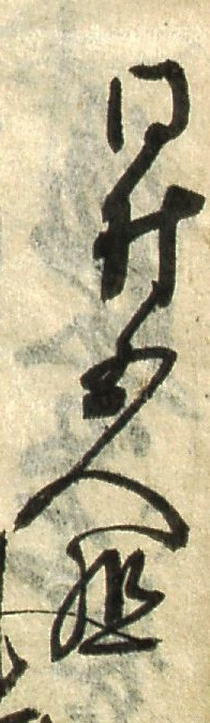同村五人組
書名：御ヶ条ヲ以被仰附株々申上帳（早渕村控）
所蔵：鳴門教育大学 Naruto University of Education
